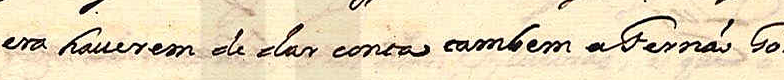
era hauerem de dar conta tambem a Fernaõ Go
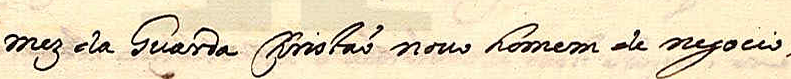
mez da Guarda Christaõ nouo homem de nogocio,
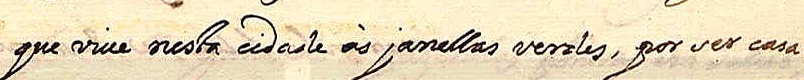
que viue nesta cidade às janellas verdes, por ser casa
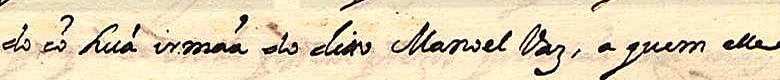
do cō huā irmaã do ditto Manoel Vaz, a quem elle
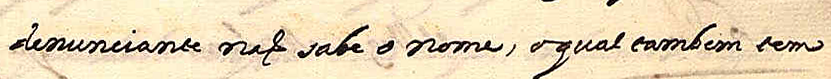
denunciante naõ sabe o nome, o qual tambem tem
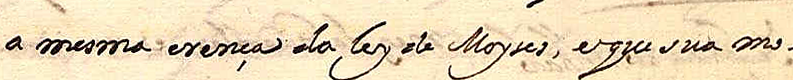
a mesma crença da ley de Moyses, e que sua mo
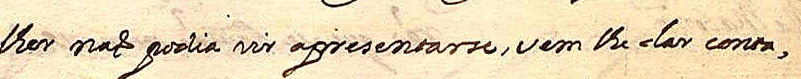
lher naõ podia vir apresentarse, sem lhe dar conta,
